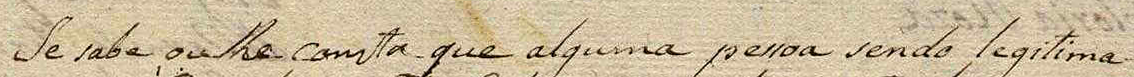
Se sabe ou lhe consta que alguma pessoa sendo legitima
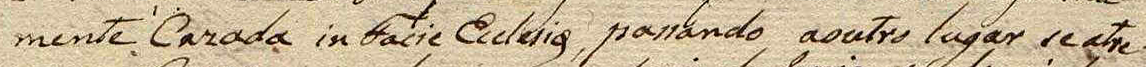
mente Cazada in Facie Ecclesiæ, passando a outro lugar se atre
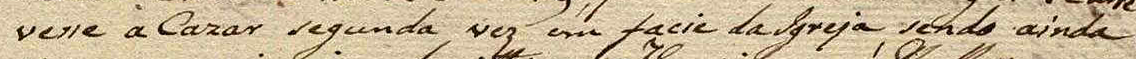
vesse a Cazar segunda vez em facie da Igreja, sendo ainda
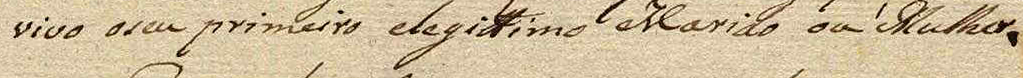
vivo o seu primeiro e legittimo Marido ou Mulher.
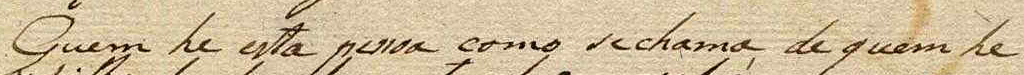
Quem he esta pessoa como se chama, de quem he
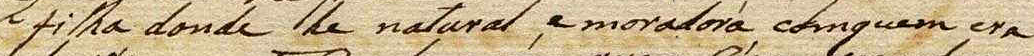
filha, donde he natural, e moradora, com quem era
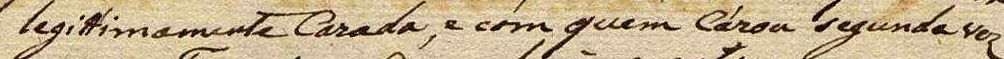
legittimamente Cazada, e com quem Cazou segunda vez
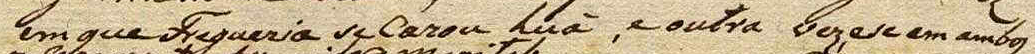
em que Freguezia se cazou huā, e outra vez, e se em ambos
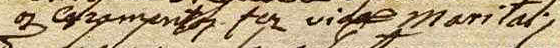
os cazamentos fez vida marital;
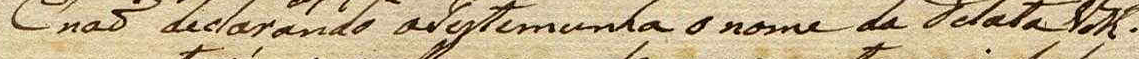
E naõ declarando a Testemunha o nome da Delata VM.
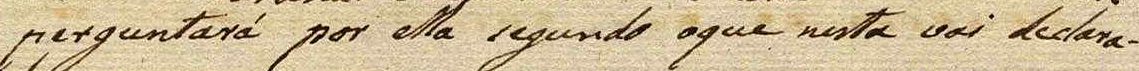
perguntará por ella segundo o que nesta vai declara
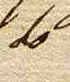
do
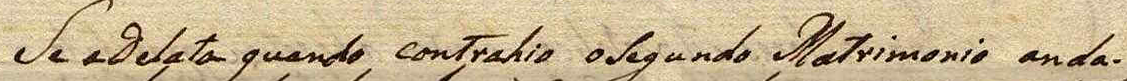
Se a Delata quando contrahio o segundo Matrimonio anda
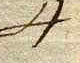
4
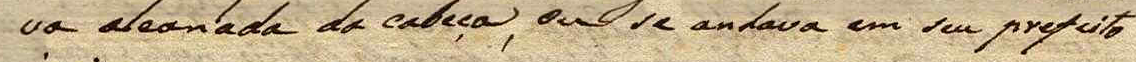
va aleonada da cabeça, ou se andava em seu prefeito
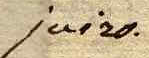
juizo.
